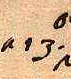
a 13.
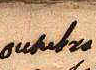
outubro
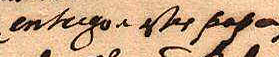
entregou estes papeis
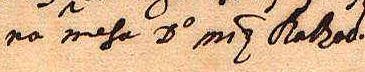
na mesa Do miz̄ Ralhaõ.
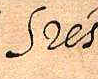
Sres̄
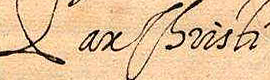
Pax Christi
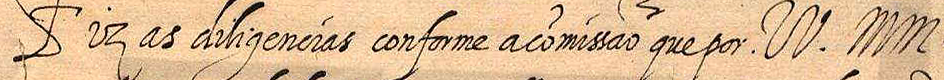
Fiz as diligencias conforme a cōmissaõ que por VV. MM.
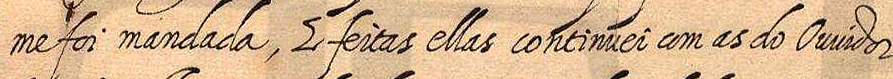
me foi mandada, E feitas ellas continuei com as do Ouuidor
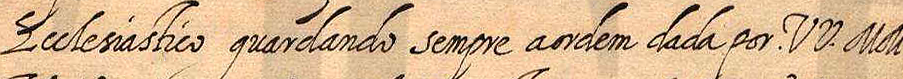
Ecclesiastico guardando sempre a ordem dada por VV. MM.
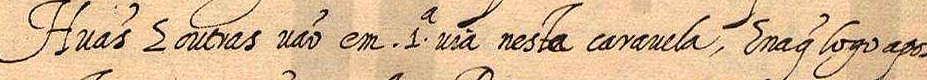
Huas̄ E outras uaõ em .1a. uia nesta carauela, E na q̄ logo apos
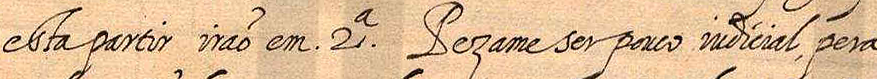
esta partir iraõ em .2a. Pezame ser pouco iudicial, pera
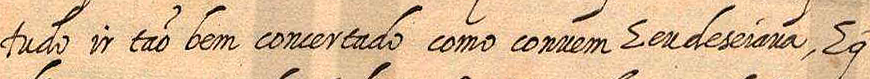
tudo ir taõ bem concertado como conuem E eu deseiaua, E q̄
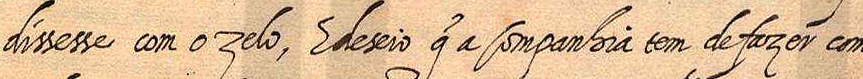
dissesse com o zelo, E deseio q̄ a Companhia tem de fazer com
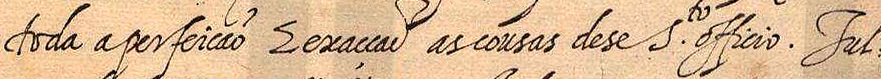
toda a perfeicaõ E exacçaõ as cousas dese S.to officio. Jul
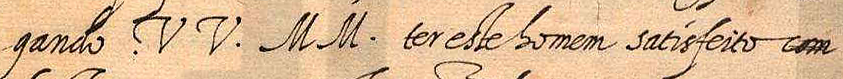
gando .VV. MM. ter este homem satisfeito com
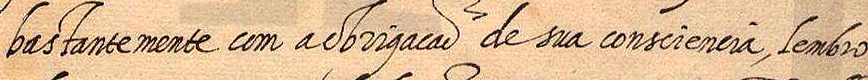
bastantemente com a obrigacaõ de sua consciencia, lembro
